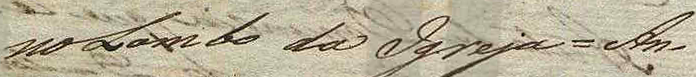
no Lombo da Igreja = An
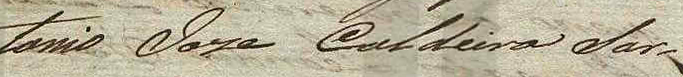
tonio Ioze Caldeira Sar
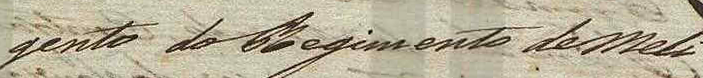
gento do Regimento de meli
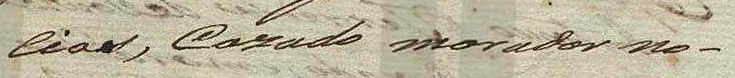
cias, cazado morador no
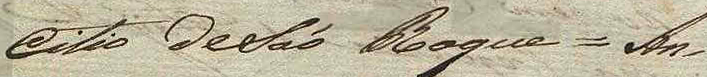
citio de Saõ Roque = An
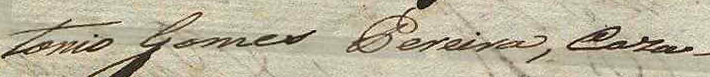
tonio Gomes Pereira, caza
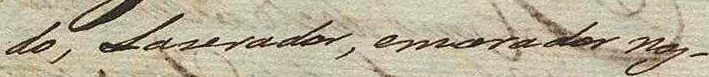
do, Lavrador, e morador nas
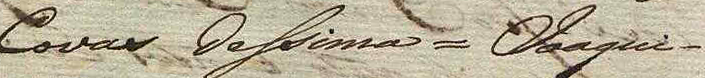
Covas de ssima = Ioaqui
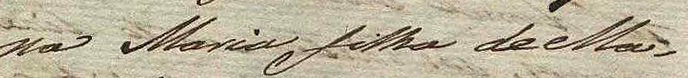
na Maria filha de Ma
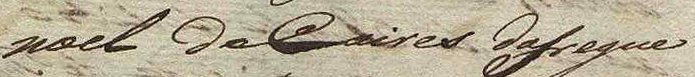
noel de Caires da fregue
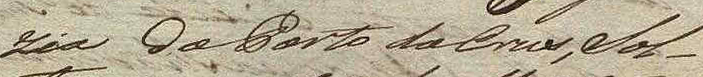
zia do Porto da Crus, Sol
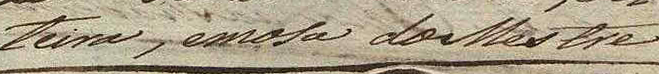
teira, e mosa do Mestre
